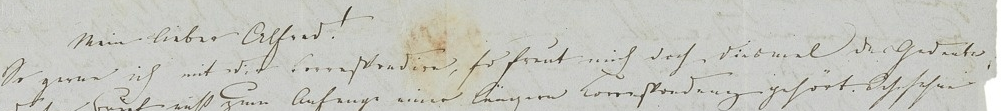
So gerne ich mit dir korrespondire, so freut mich doch diesmal der Gedanke,
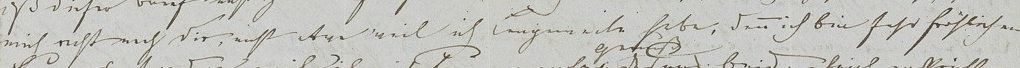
mich recht nach dir, nicht etwa weil ich Langeweile habe, denn ich bin sehr fröhlichen
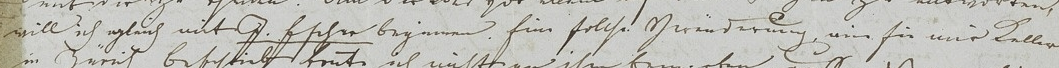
will ich gleich mit J. Escher beginnen. Eine solche Veränderung, wie sie mir Keller
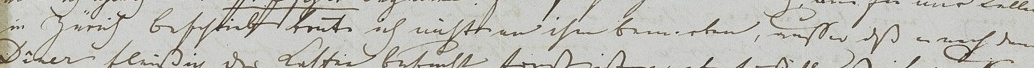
in Zürich beschrieb konnte ich nicht an ihm bemerken, ausserdß er nach dem
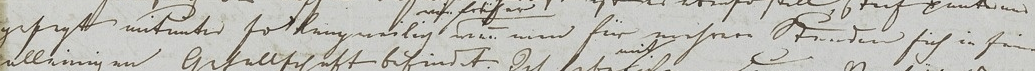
gesagt mitunter so langweilig wie früher wenn man für mehrere Stunden sich in seiner
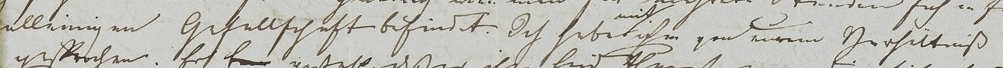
alleinigen Gesellschaft befindet. Ich habe mit ihm von eurem Verhältniß
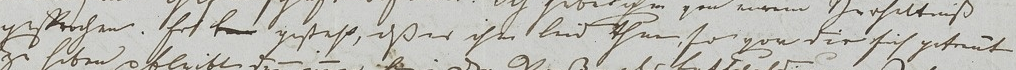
gesprochen. Er kan gesteht, dß es ihm leid thue, so von dir sich getrennt
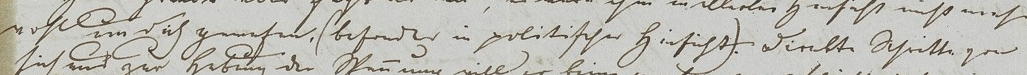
wohl um dich gewesen, (besonders in politischer Hinsicht). Direkte Schritte von
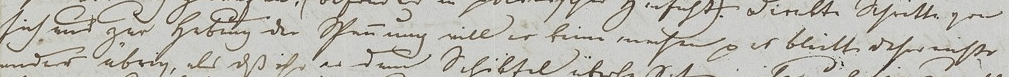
sich aus zur Hebung der Spannung will er keine machen & es bleibt daher nichts
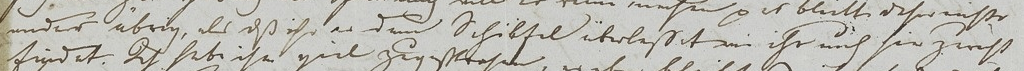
anders übrig, als dß ihr es dem Schiksal überlasset wie ihr euch hier zurecht
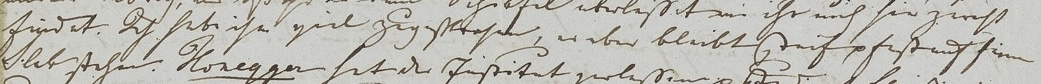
findet. Ich habe ihm viel zugesprochen, er aber bleibt steif & fest auf seinem
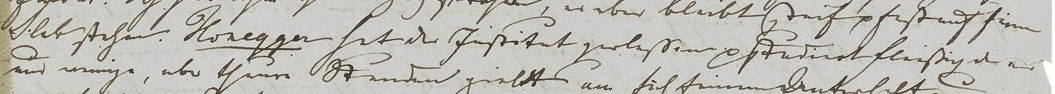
Flek stehen. Honegger hat das Institut verlassen & studiert fleißig da er
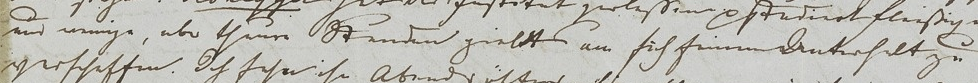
nur wenige, aber theure Stunden giebt um sich seinen Unterhalt zu
